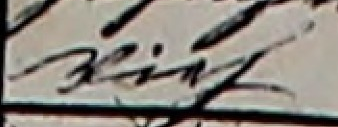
Zechalgen Vieh
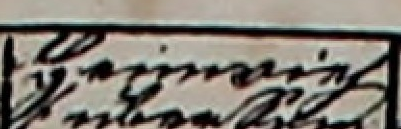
Heimvieh
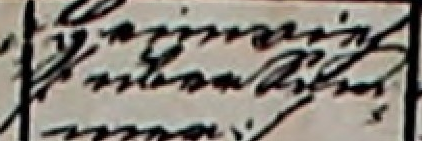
über S???
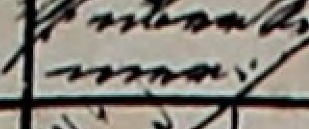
mer.
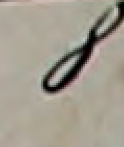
8
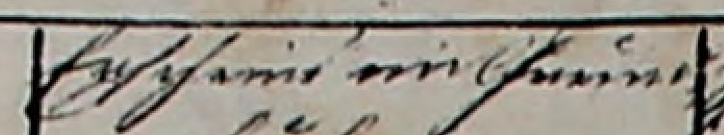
Erscheint im Grund„
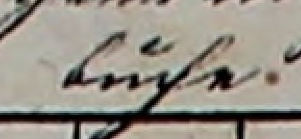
buche
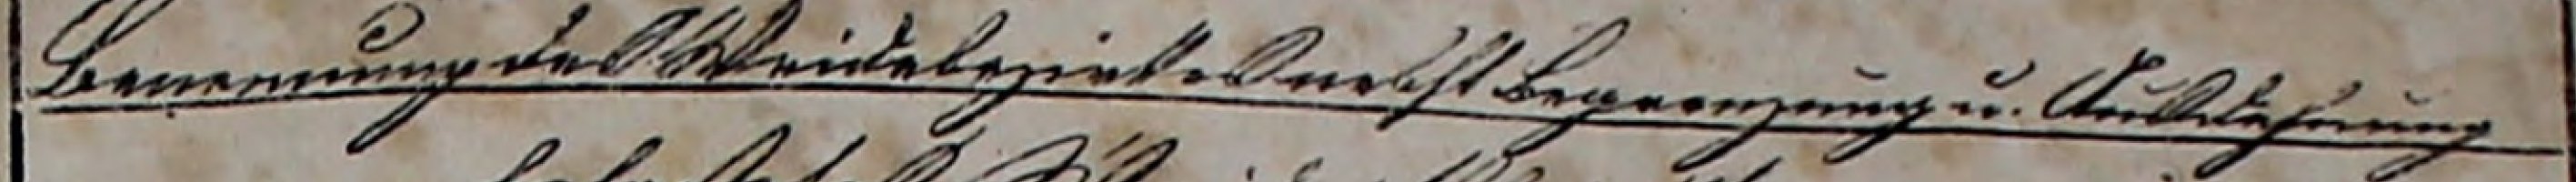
Benennung des Weidabezirkes nebst Begrenzung u. Ausdehnung
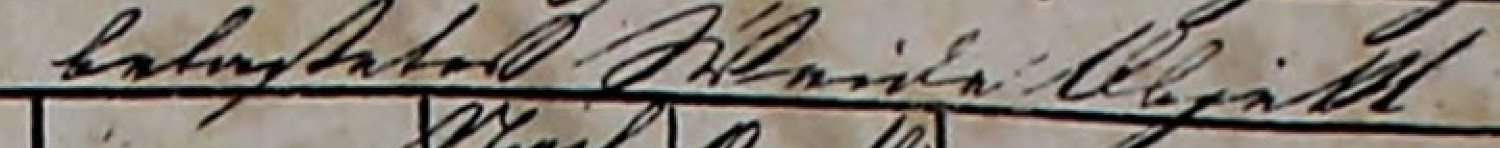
belaßetes Weide Objekt
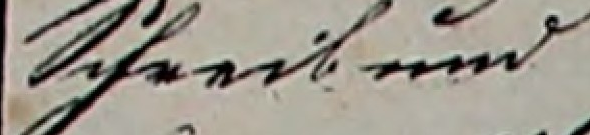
Schreib und
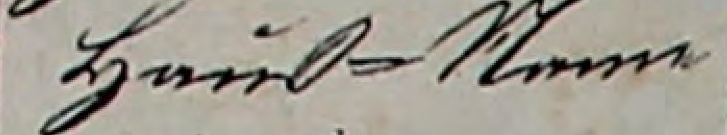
Haus=Name
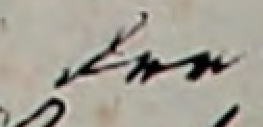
der
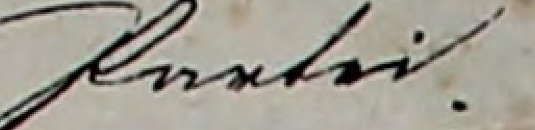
Partei
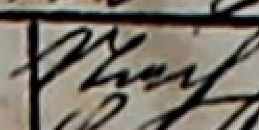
Nach
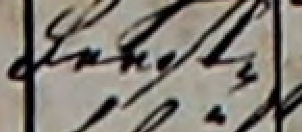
Seest„
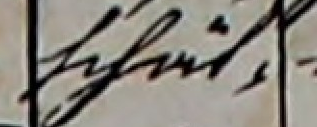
eschät„
